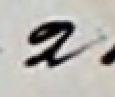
2
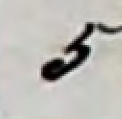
5
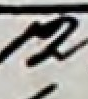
12
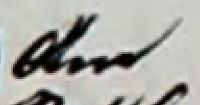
Am
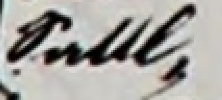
Sattl„
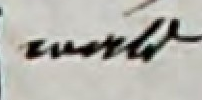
wald
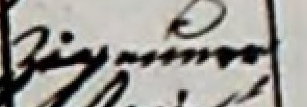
Ziegneuer„
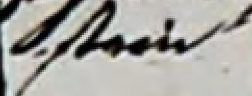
stein
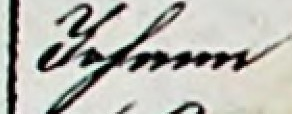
Johann
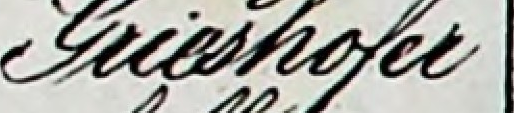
Grieshofer
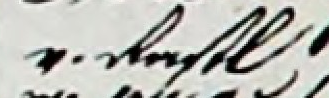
v. Rastl
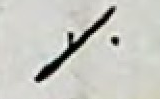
./.
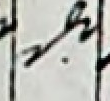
Do
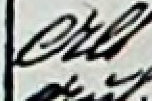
Alt
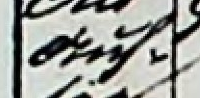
Aus„
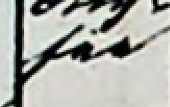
see
